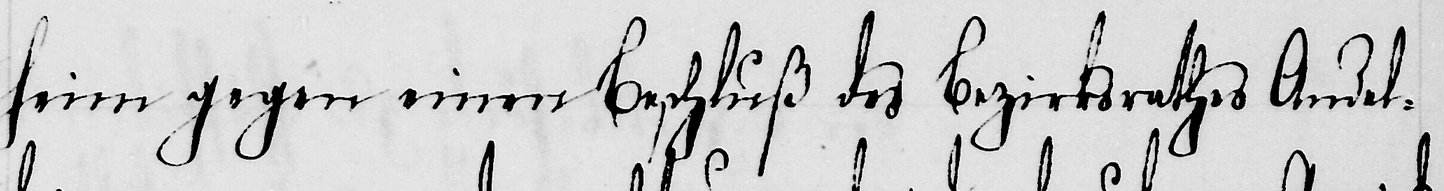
heim gegen einen Beschluß des Bezirksrathes Andel¬
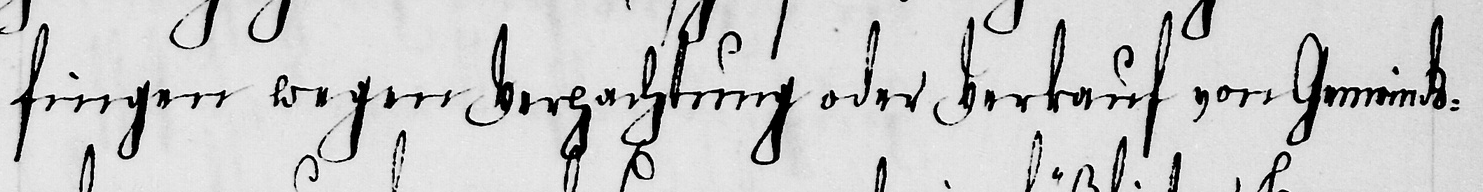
fingen wegen Verpachtung oder Verkauf von Gemeinds¬
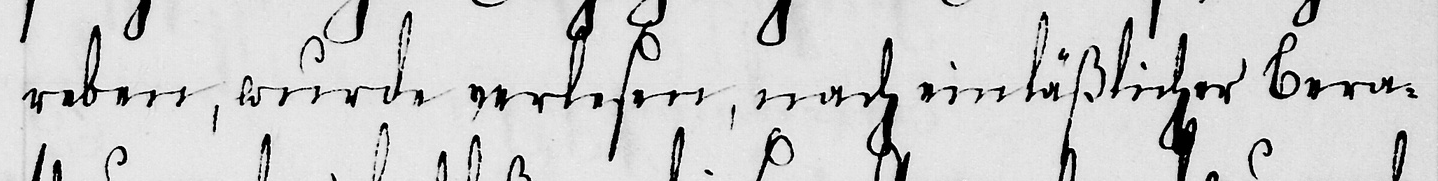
reben, wurde verlesen, nach einlässlicher Bera¬
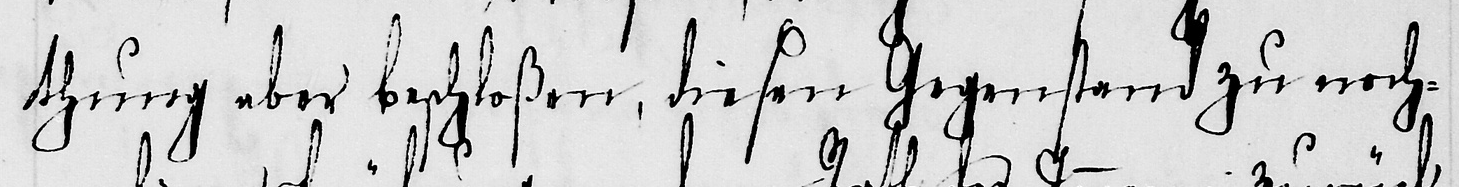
thung aber beschlossen, diesen Gegenstand zu noch¬
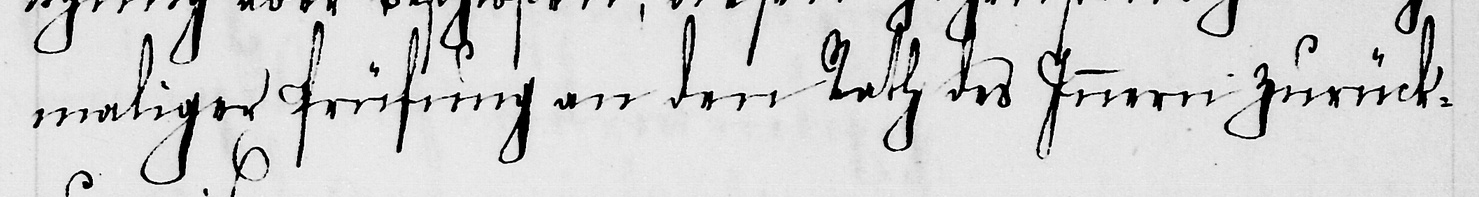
maliger Prüfung an den Rath des Innern zurück¬
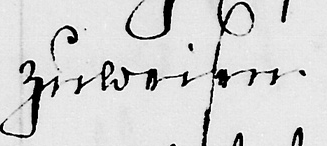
zuweisen.
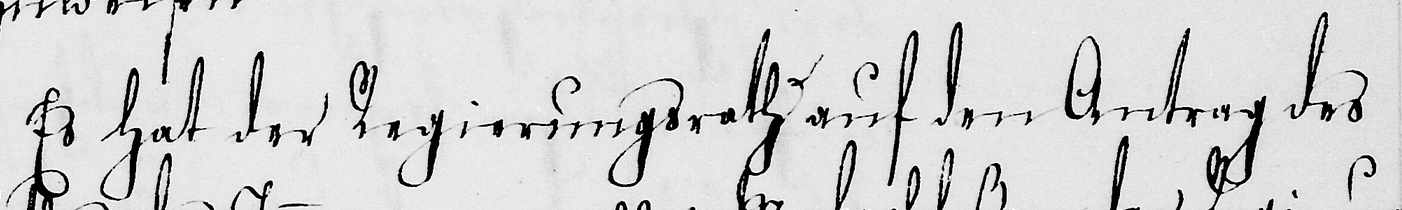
Es hat der Regierungsrath auf den Antrag des
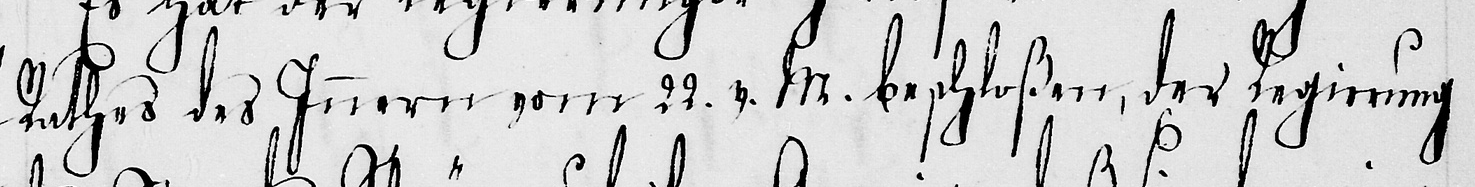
Rathes des Innern vom 22 v. M. beschlossen, der Regierung
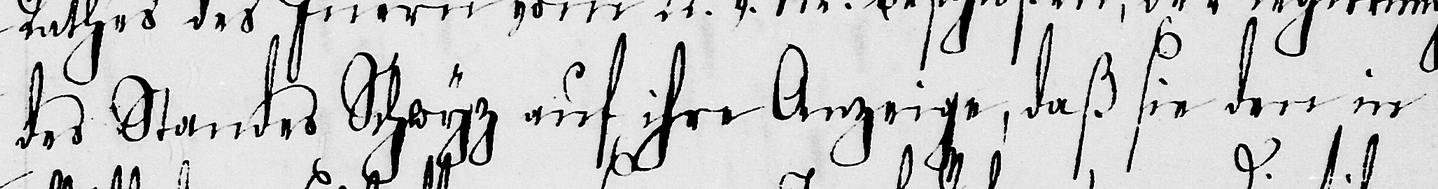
des Standes Schwyz auf ihre Anzeige, daß sie den in
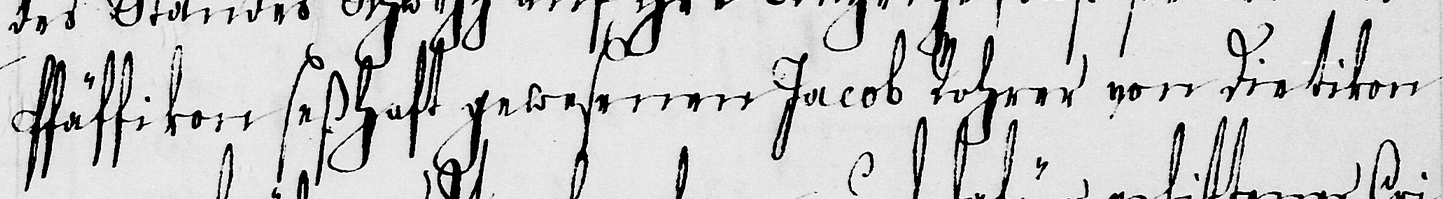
Pfäffikon seßhaft gewesenen Jacob Rohrer von Dietikon
